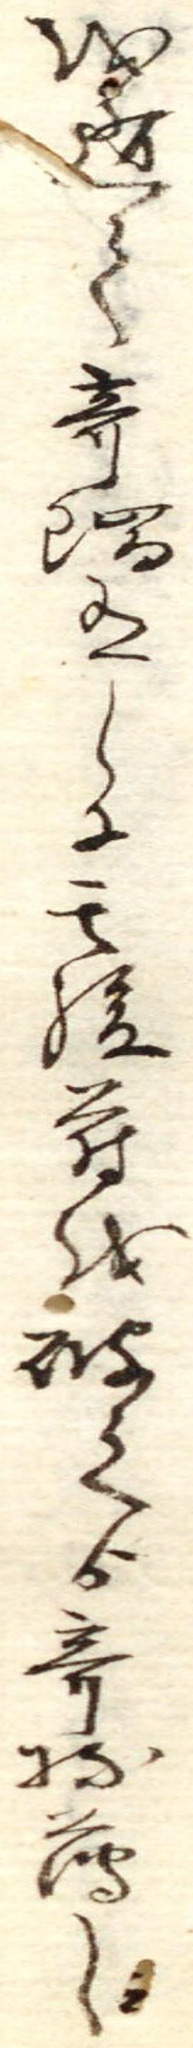を遁て奇瑞有しに其後符を破てゟ奇特落し
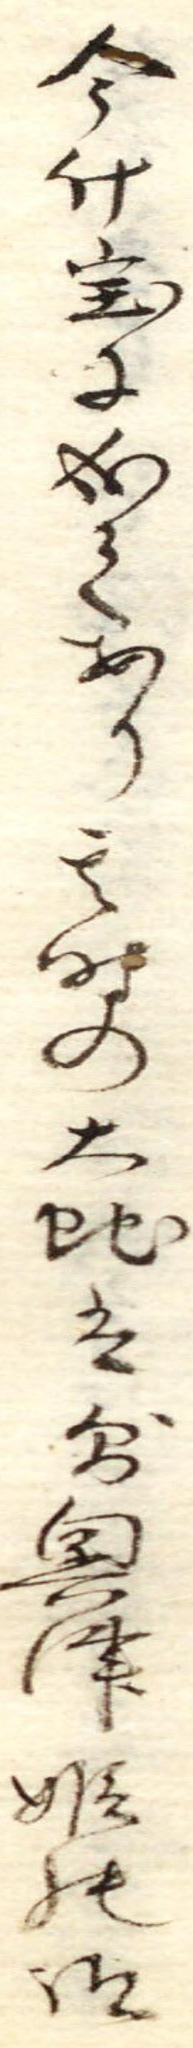今什宝に成てあり其時の大蛇は則奥津姫の御
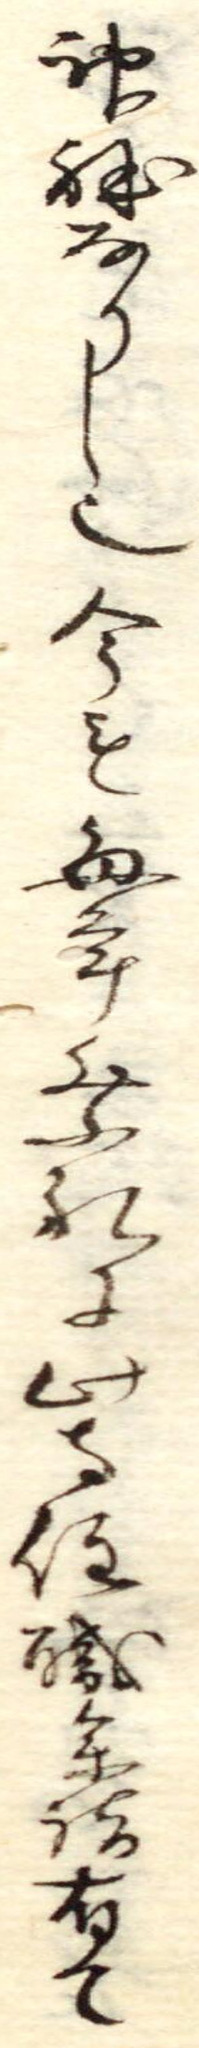神体なりし也今も毎年祭礼に此寺住職参詣有て
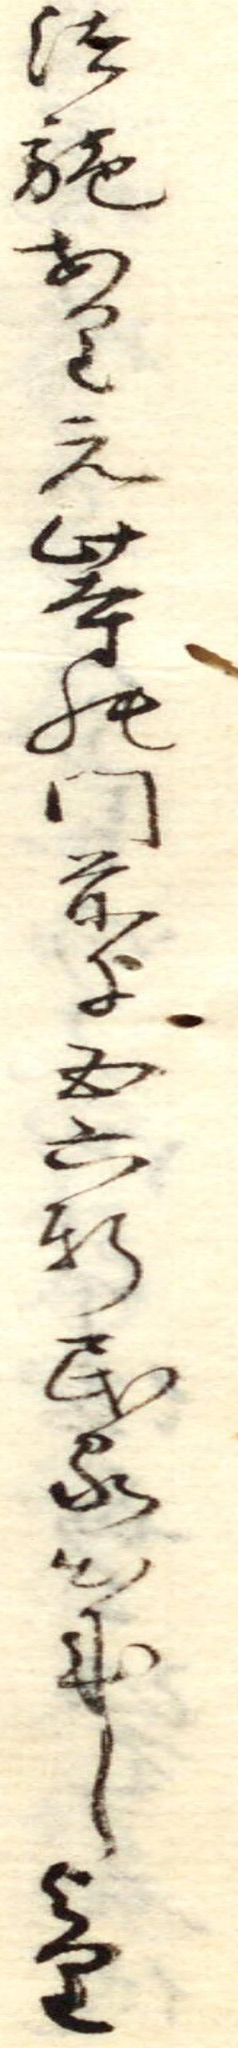法施あり元此寺の門前に五六軒民家出来しより
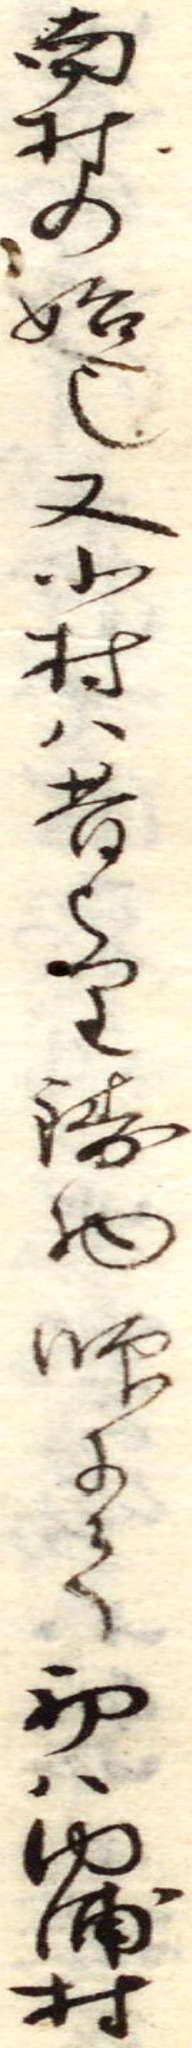南村の始也又北村は昔より鋳物師にて初は内浦村
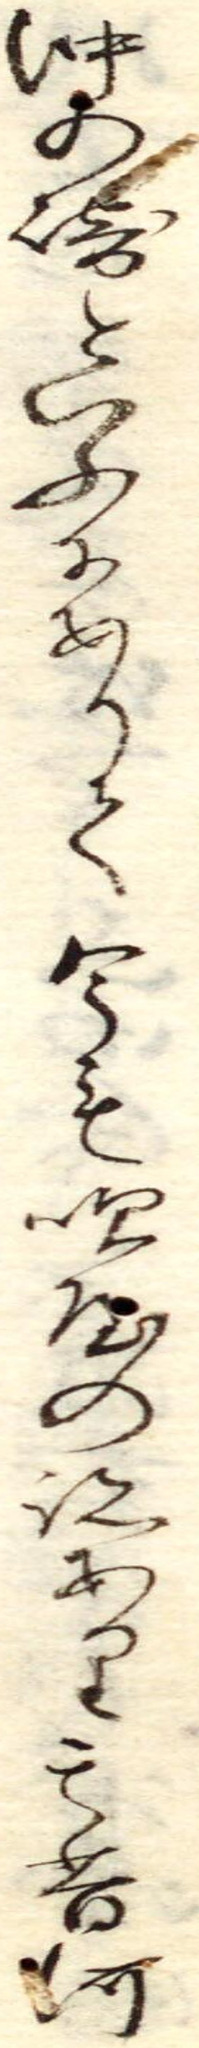沖の崎といふにありて今も吹屋の跡あり其昔河
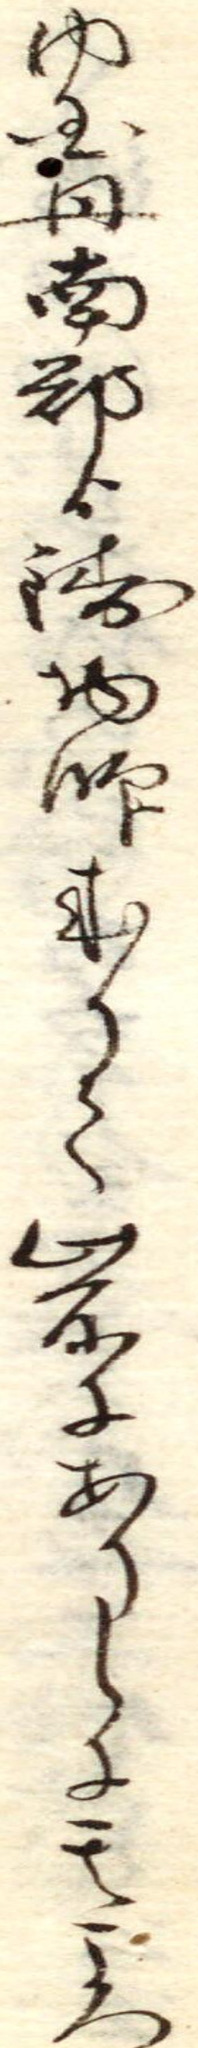内国丹南郡ゟ鋳物師来りて此所にありしに其ころ
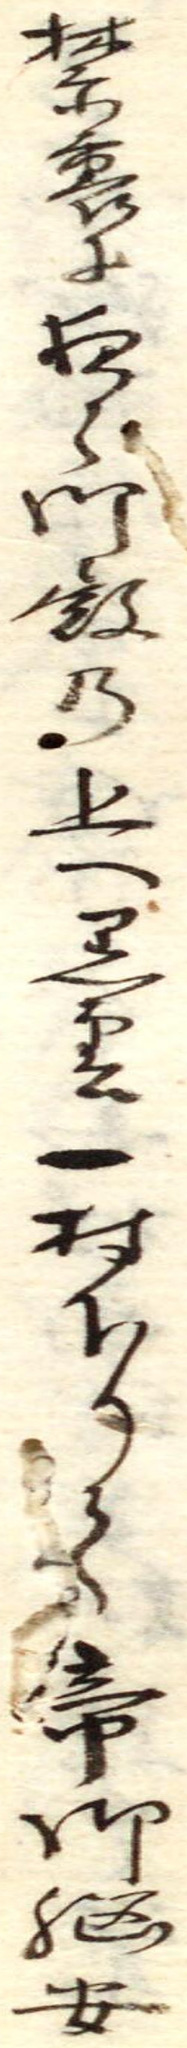禁裏に夜々御殿の上へ黒雲一村下りて帝御悩安
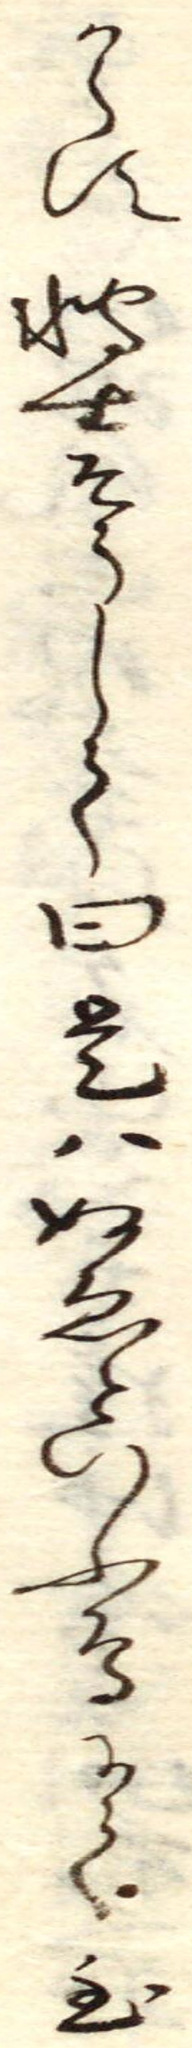からす転士そうして曰是はぬゑといふ鳥にて至
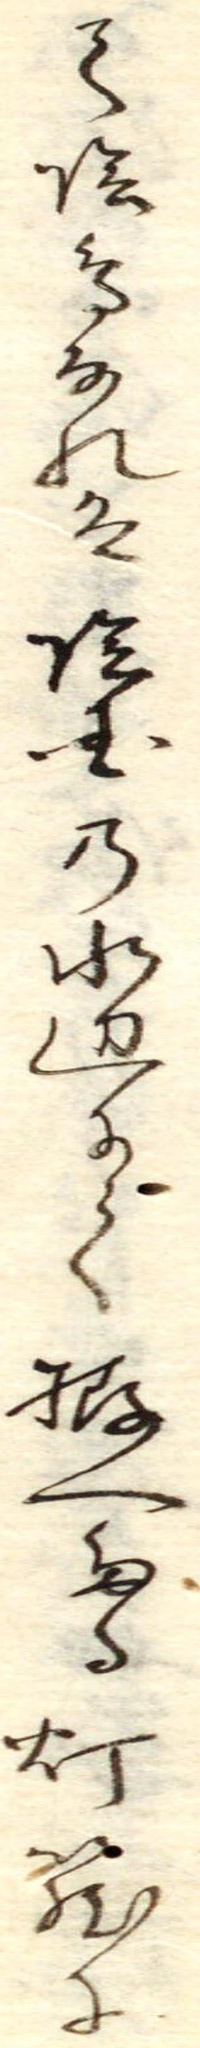て陰鳥なれは陰国の水辺にて拵へたる灯籠に
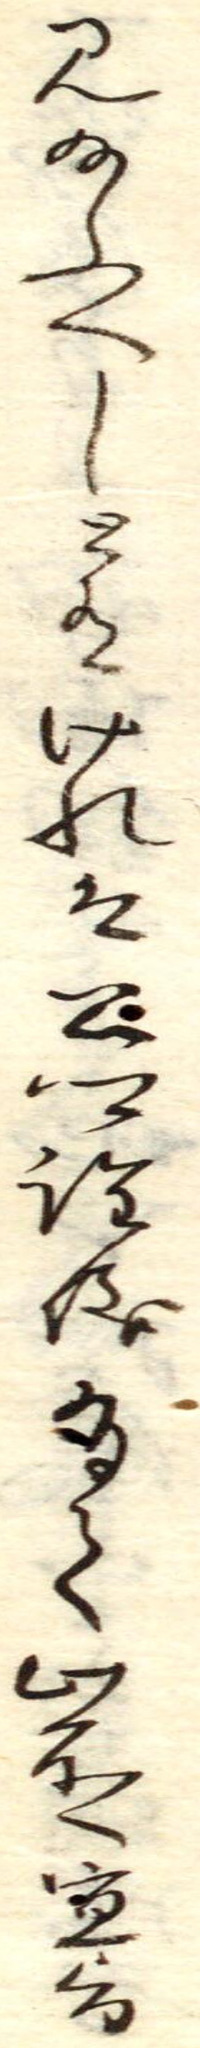見給ふへしと有けれは公卿詮議有て此所へ宣旨
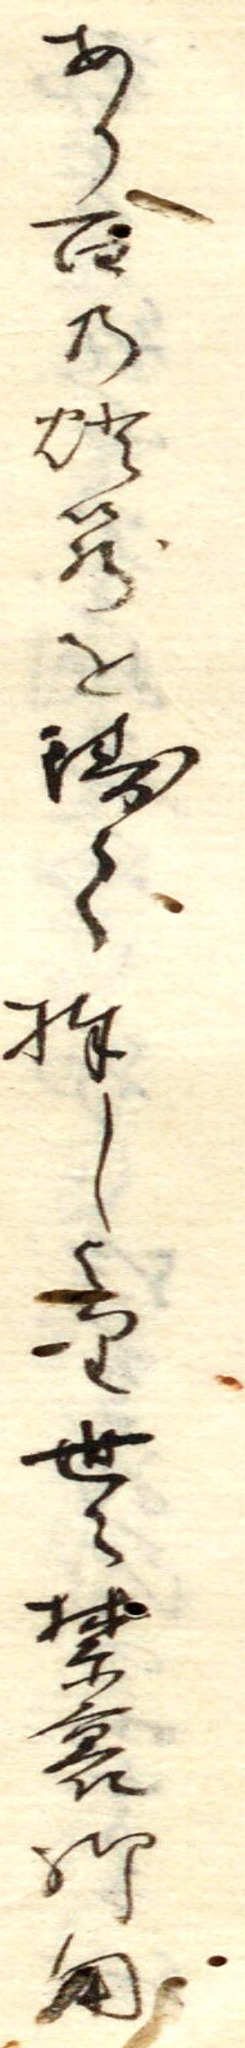あり百の灯籠を鋳て捧しより世々禁裏御用

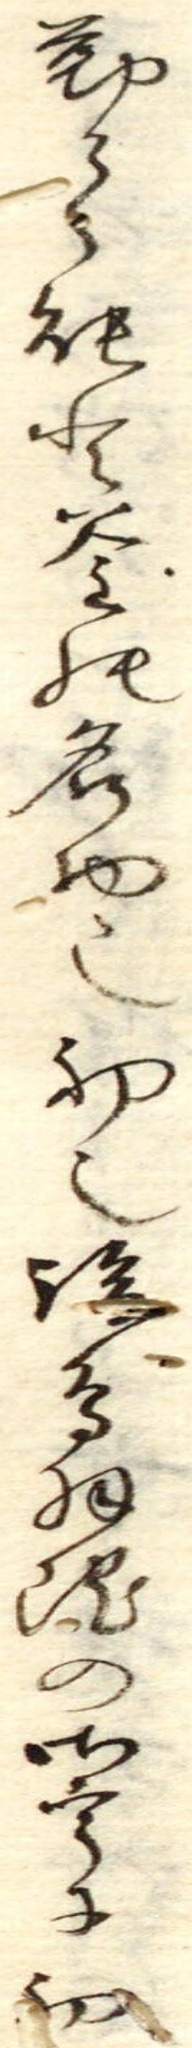勤て能登釜の名物也初也後鳥羽院の御宇に初
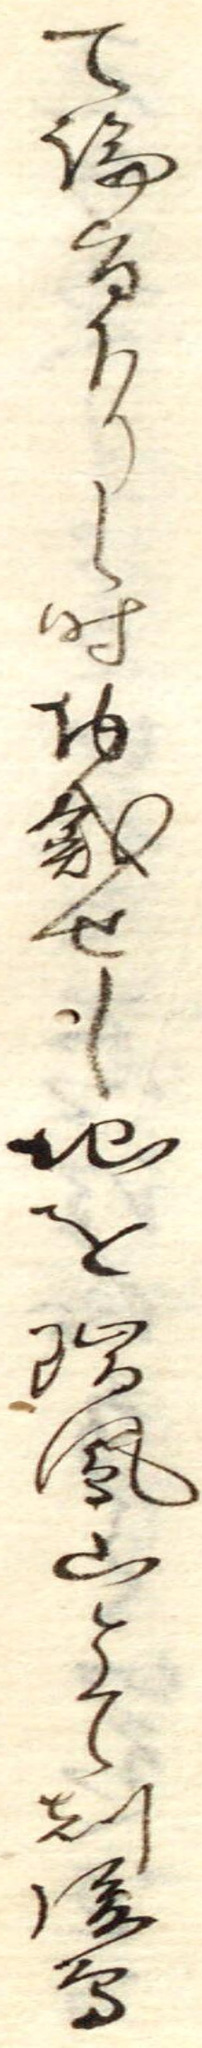て綸旨下りし時拝戴せし地を瑞鳳山とて則御鳥
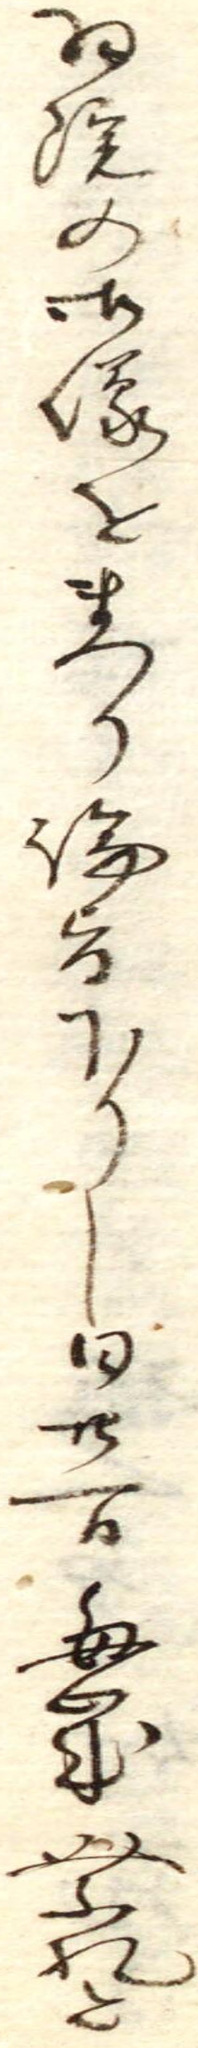羽院の御像をまつり綸旨下りし日廿一日毎歳祭礼を
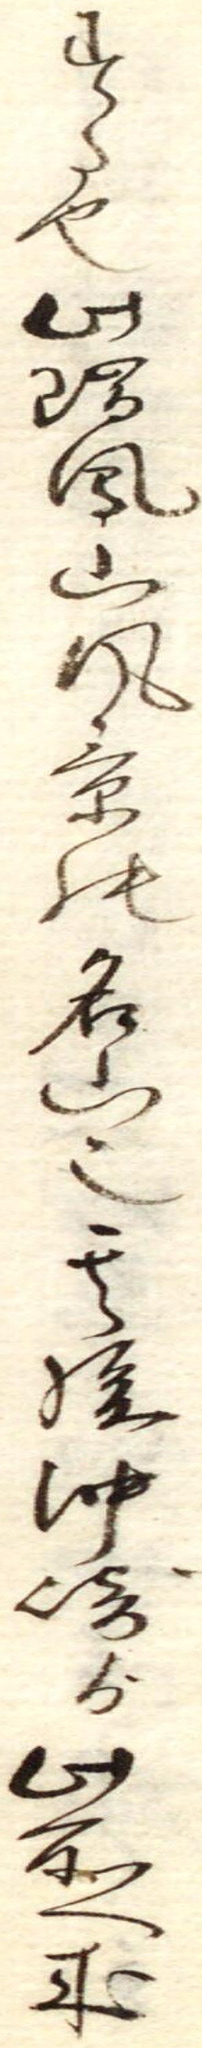する也此瑞鳳山風景の名山也其後沖崎ゟ此所へ来
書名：能登名跡誌
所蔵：Ishikawa Prefectural Library
